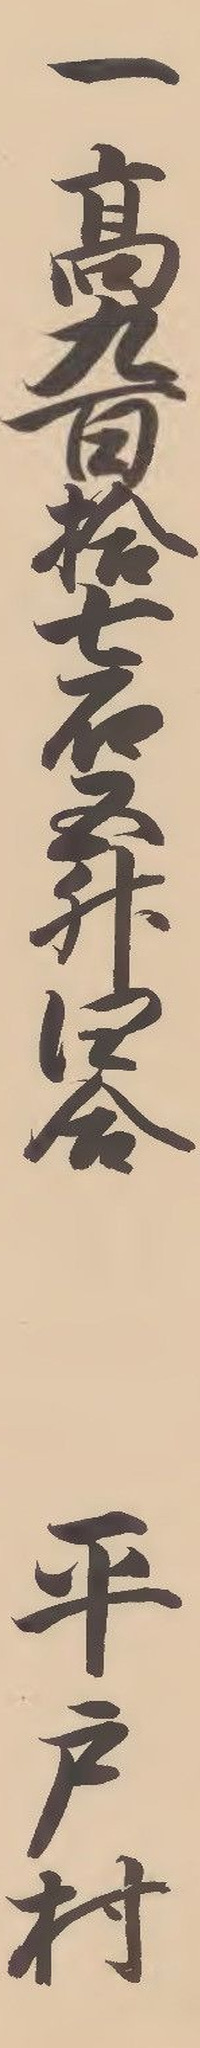一高九百拾七石五升四合平戸村
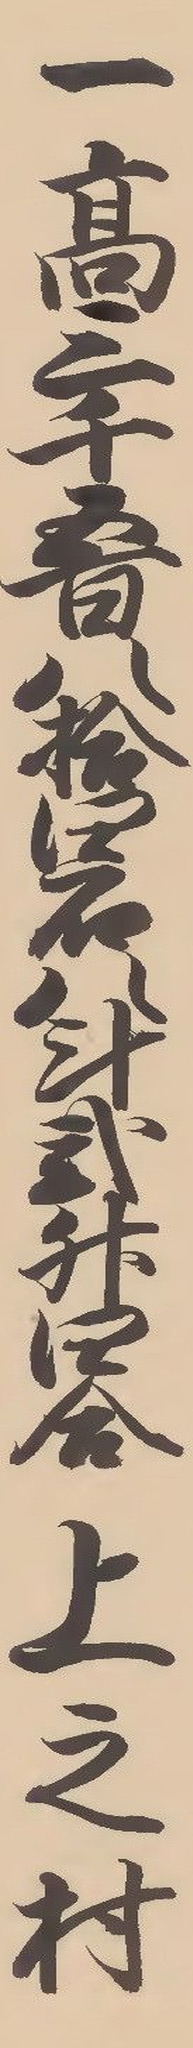一高三千五百八拾四石八斗弐升四合上之村
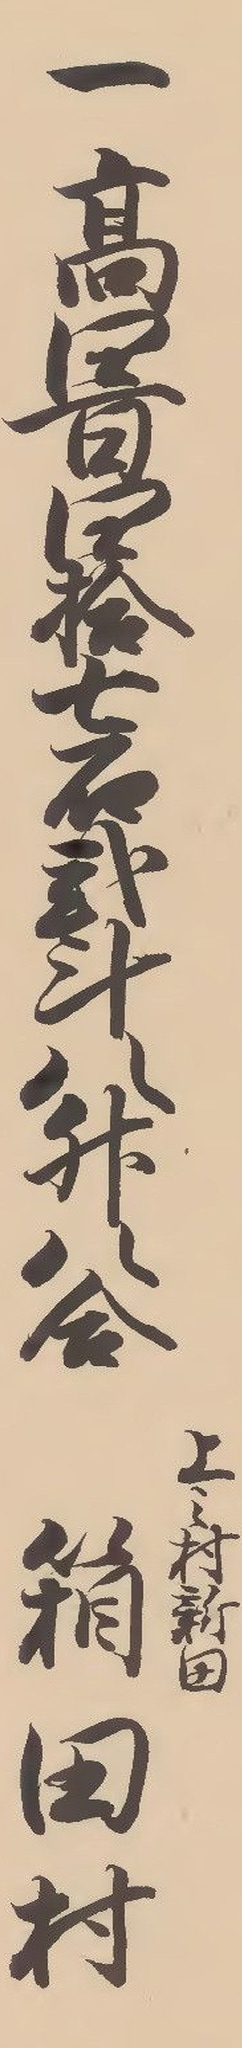一高四百四拾七石弐斗八升八合箱田村
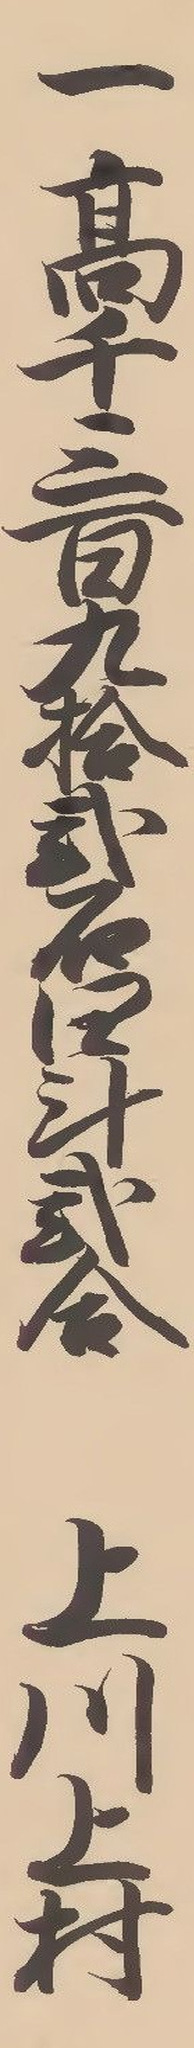一高千三百九拾弐石四斗弐合上川上村
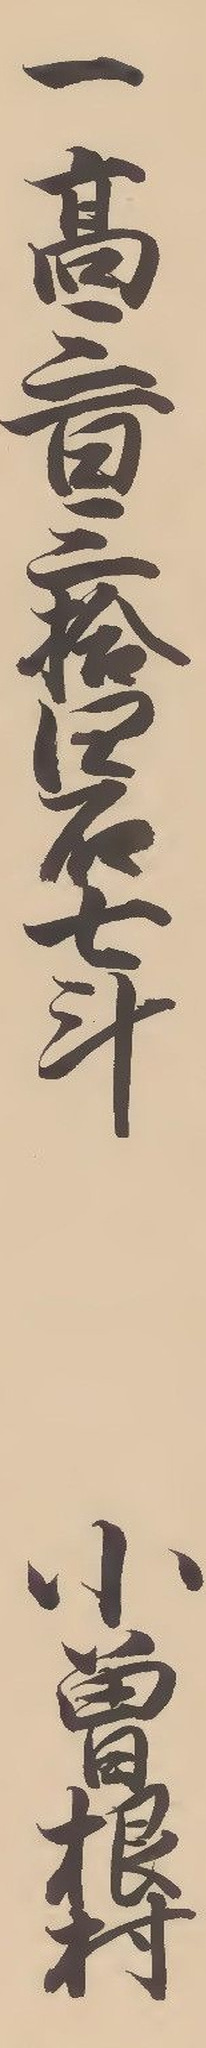一高三百三拾四石七斗小曽根村
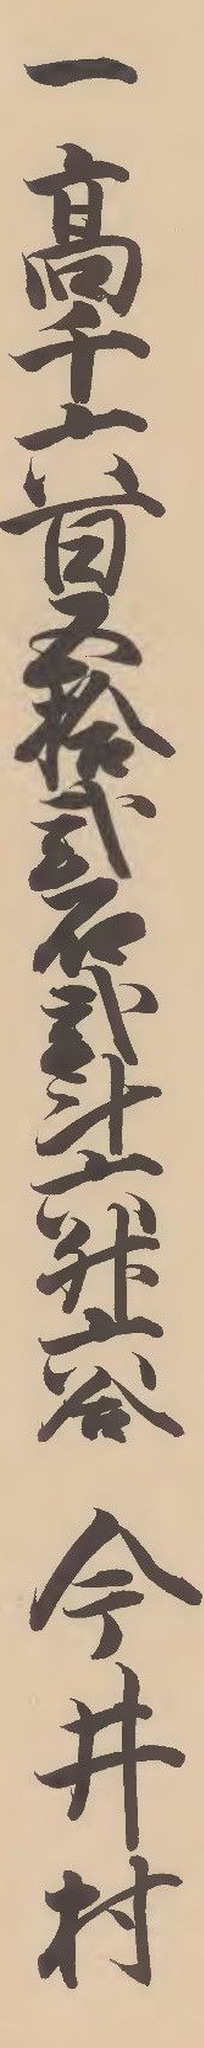一高千六百五拾弐石弐斗六升六合今井村
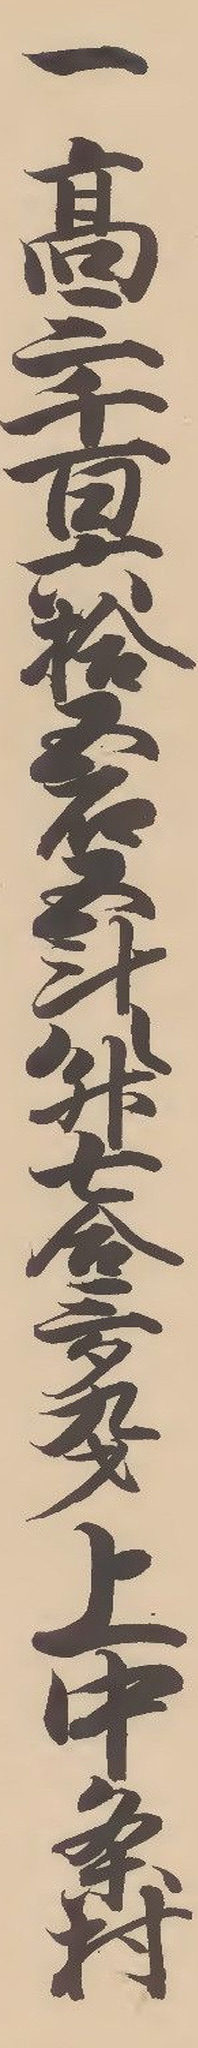一高三千六拾五石五斗八升七合三勺九才上中条村

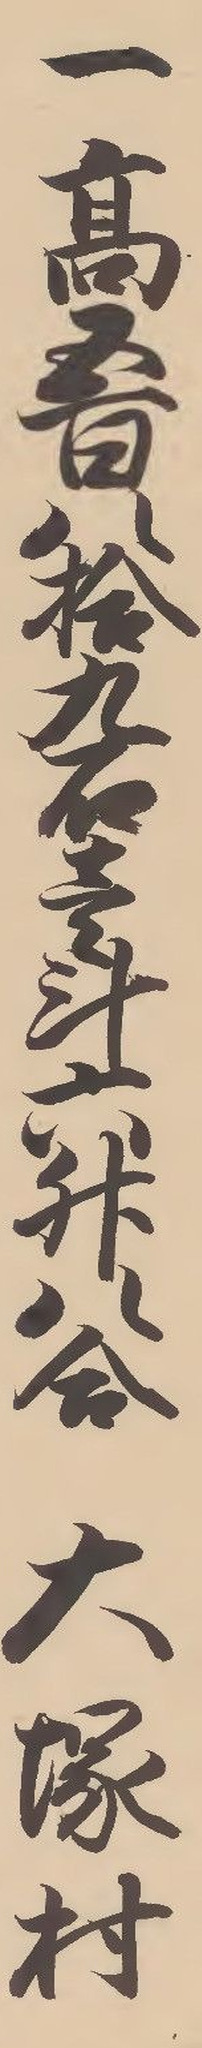一高五百八拾九石壱斗六升八合大塚村
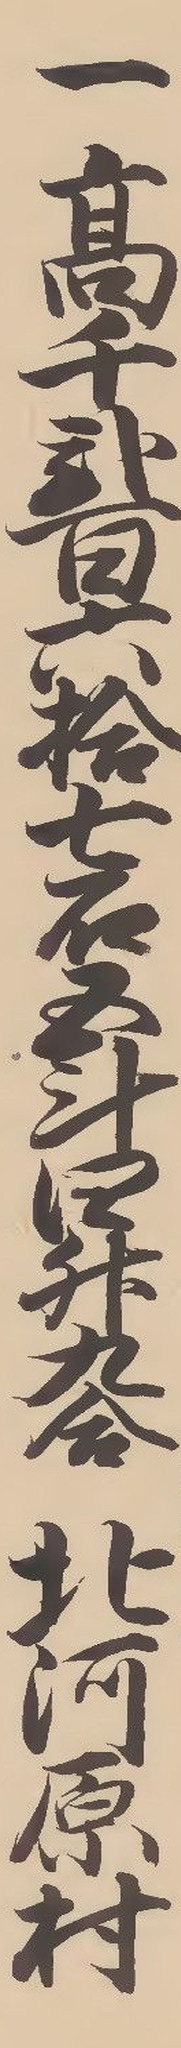一高千弐百六拾七石五斗四升九合北河原村
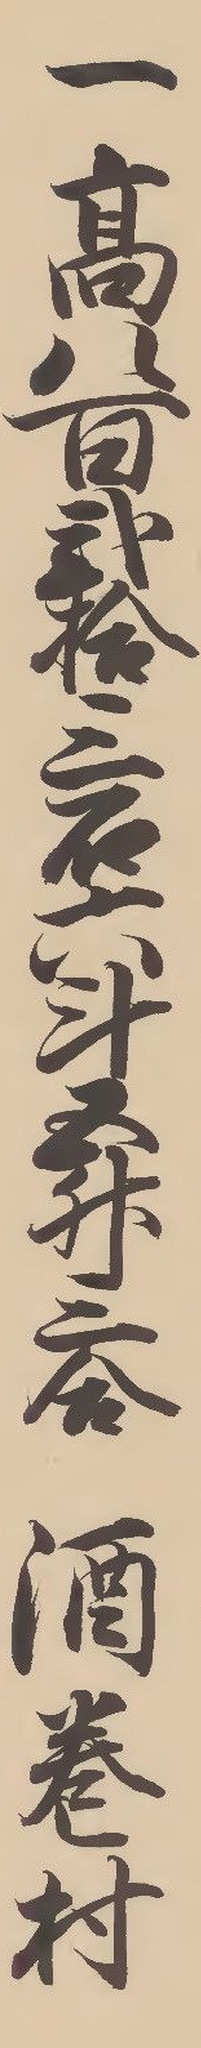一高八百弐拾三石六斗五升三合酒巻村
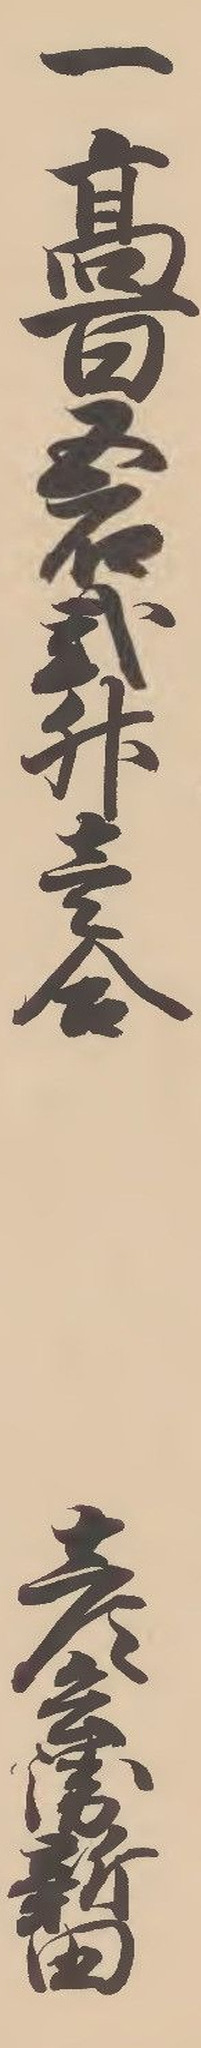一高百五石弐升壱合彦兵衛新田
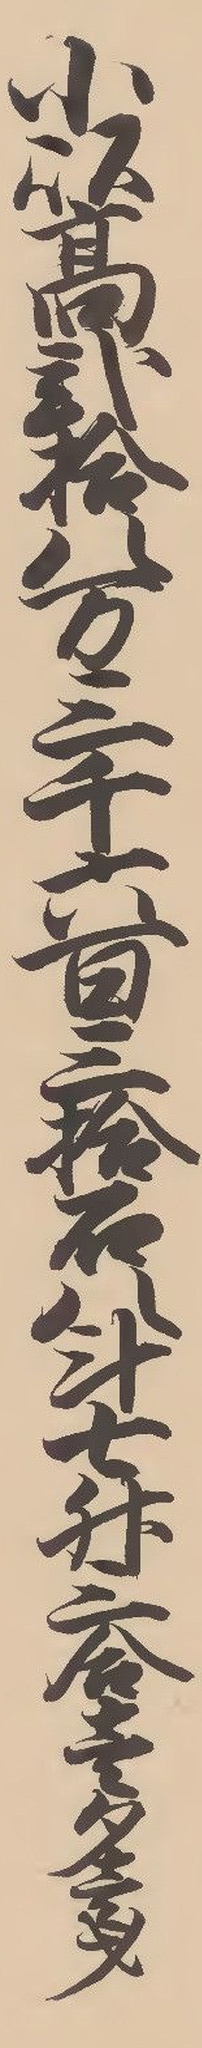小以高弐拾八万三千六百三拾石八斗七升三合壱勺壱才

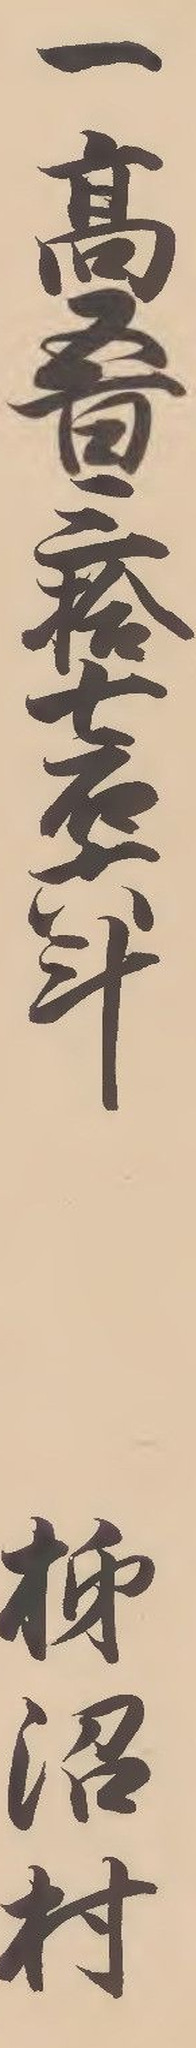一高五百三拾七石六斗柿沼村
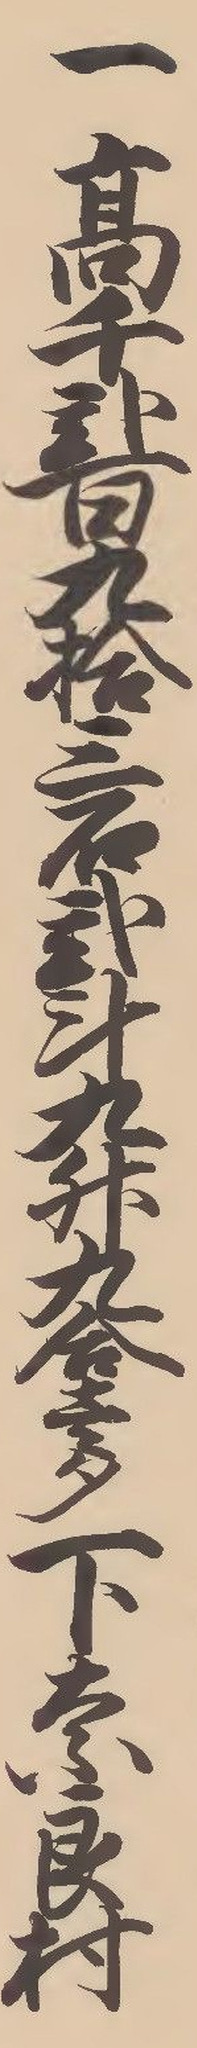一高千弐百九拾三石弐斗九升九合壱勺下奈良村
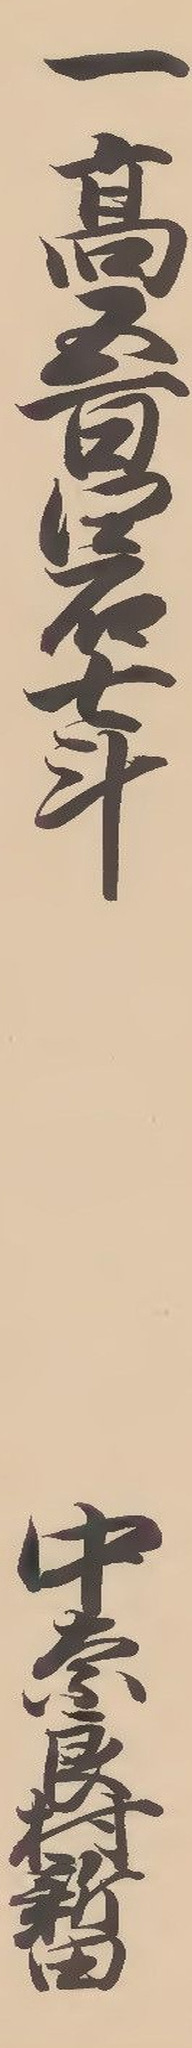一高五百四石七斗中奈良村新田
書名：武蔵国郷帳　下
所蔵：国立公文書館 National Archives of Japan
